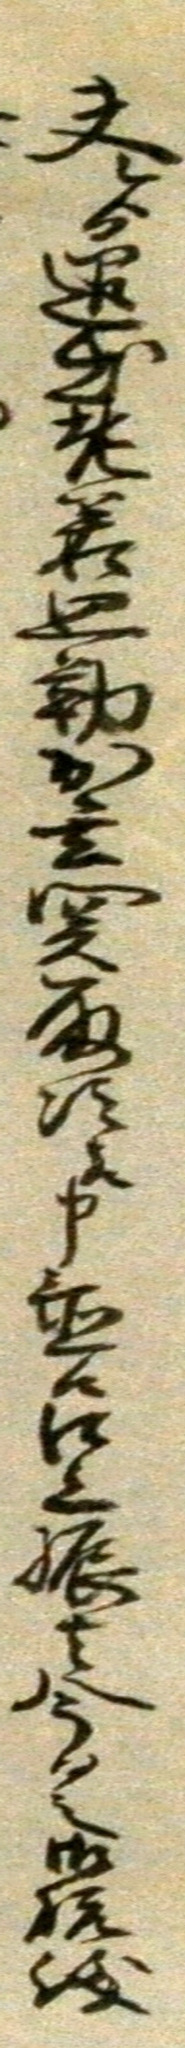一夫レゟ退出老若廻勤於玄関取次え申置候口上振は今日之御祝儀
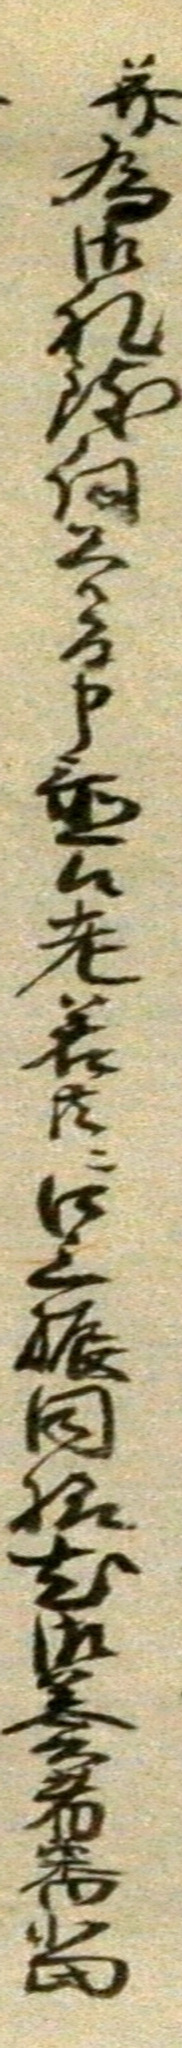并為御礼致伺公候旨申置候老若共ニ口上振同様尤御奏者番当
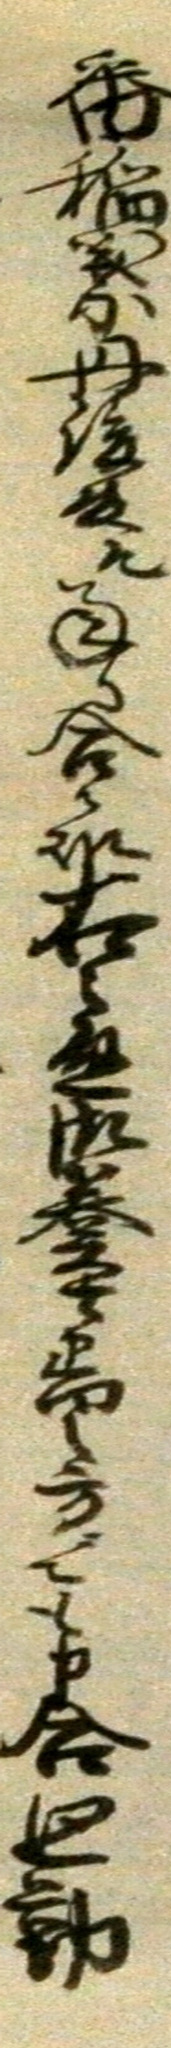番稲葉丹後殿え承り合候処右之通御奏者番之方ニても申合廻勤
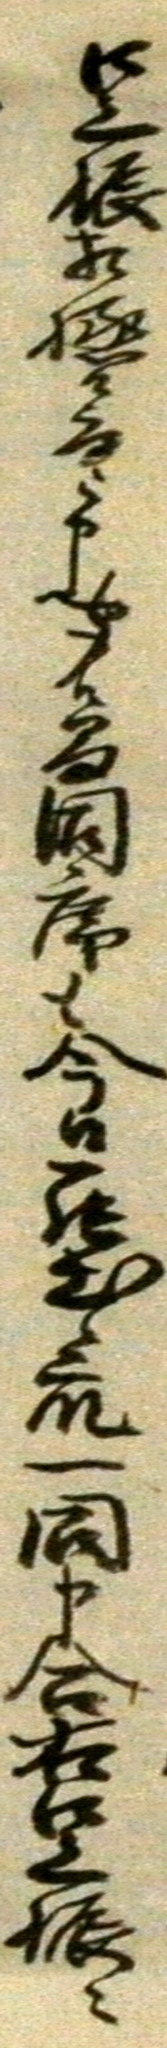口上振相極候旨被申聞候間同席も今日罷出候衆一同申合右口上振ニ
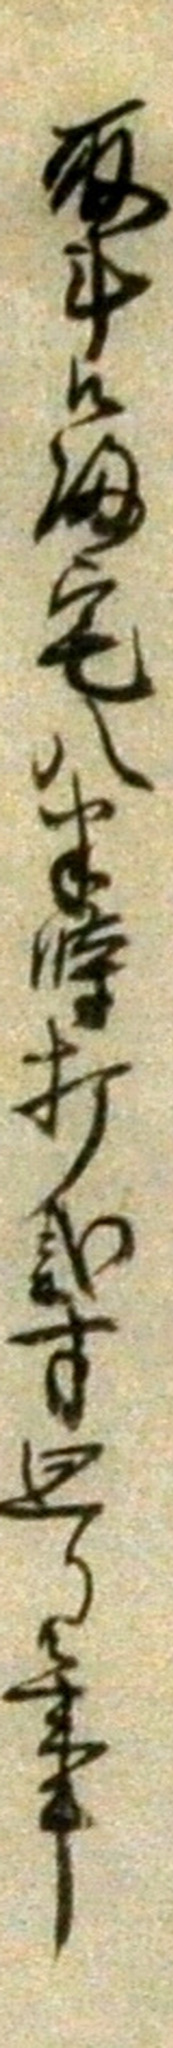取計候帰宅八半時打弐寸廻り候事
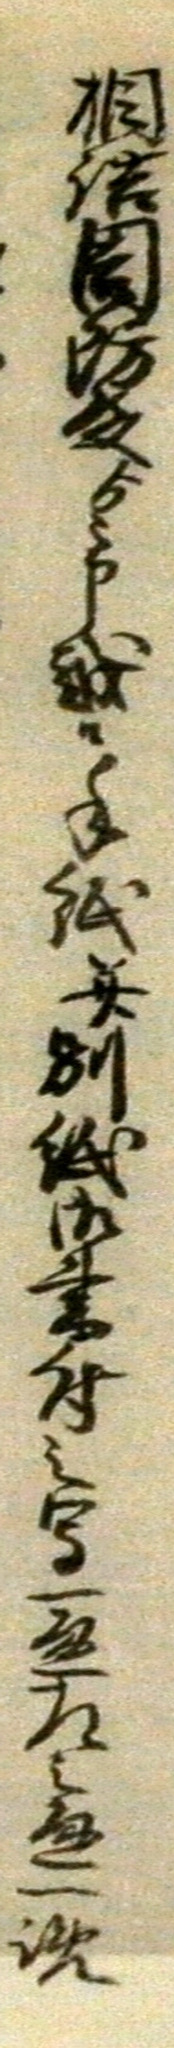一相詰周防殿ゟ被申越候手紙并別紙御書付之写一通左之通一覧
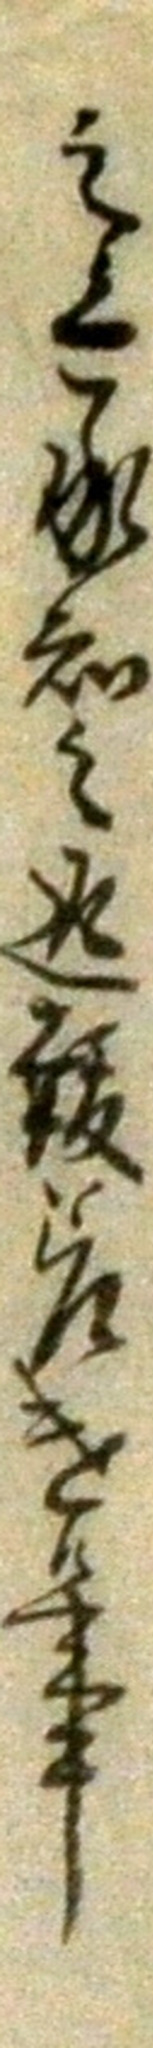之上承知之返報差遣候事
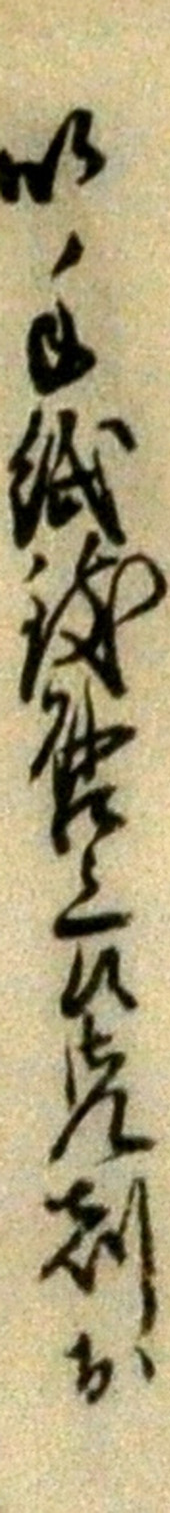以手紙致啓上候先刻於
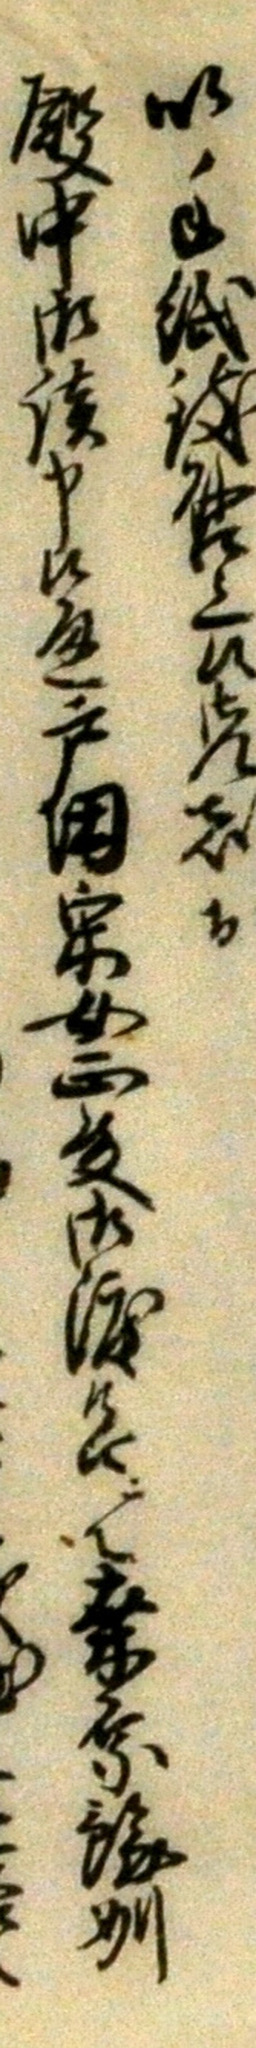殿中御談申候通戸田采女正殿御渡候由ニて桑原豫州
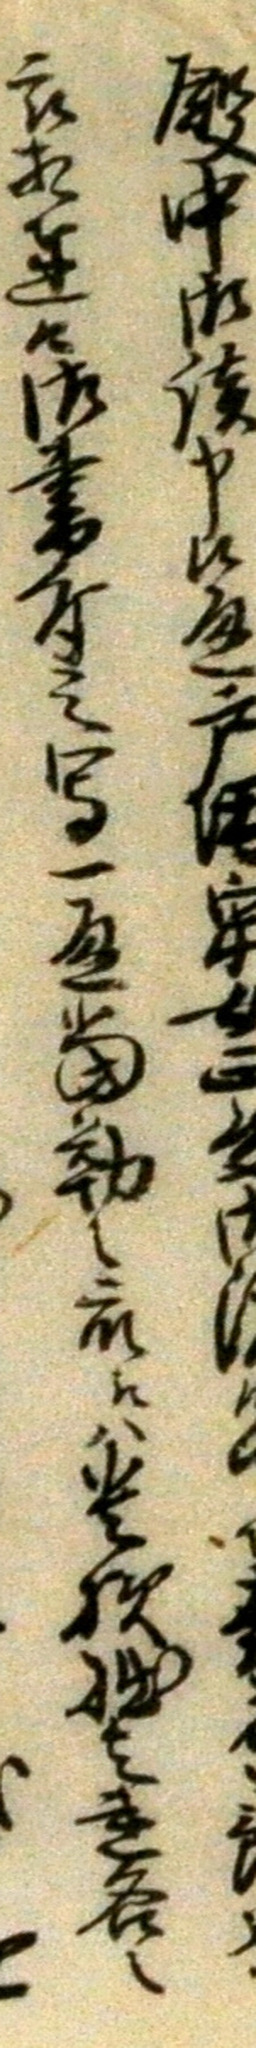被相達候御書付之写一通当勤之衆えハ貴様拙者連名之
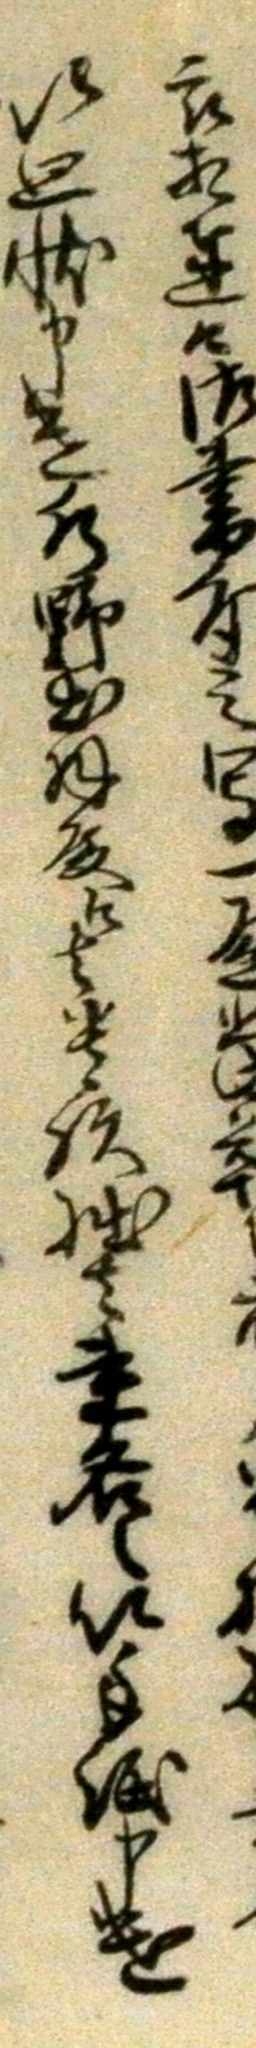以廻状申遣水野出羽殿えは貴様拙者連名之以手紙申遣
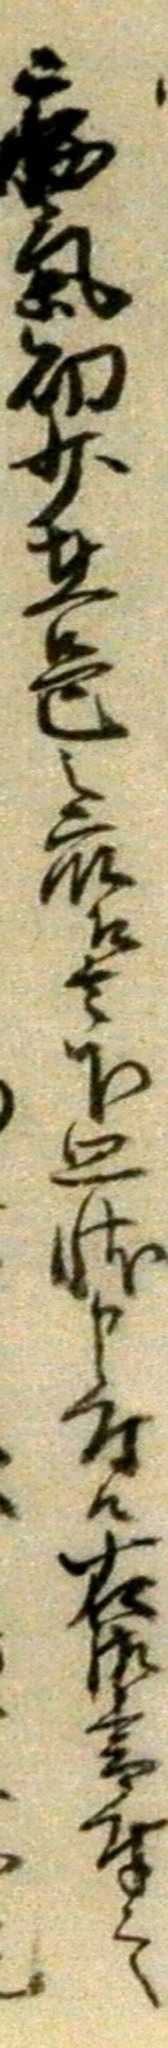病気幼少在邑之衆えは下廻状申付候右御書付之
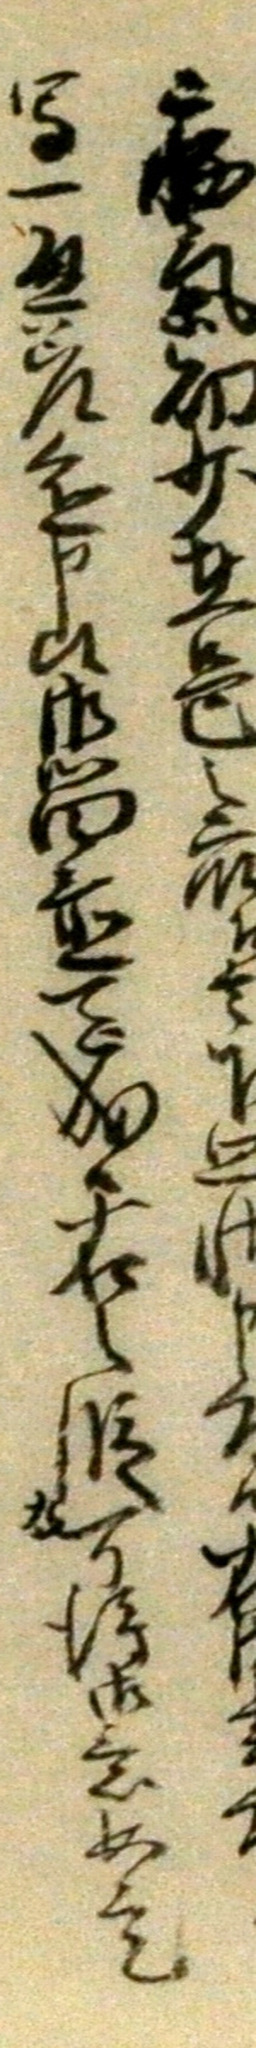写一通差進申候御留置可被成候右之段為可得御意如是
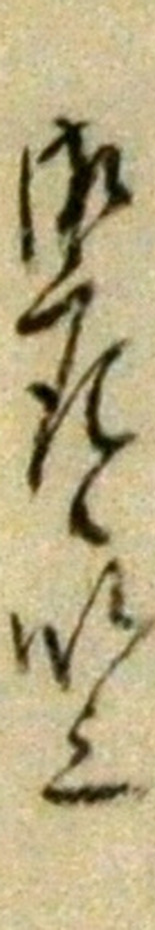御座候以上
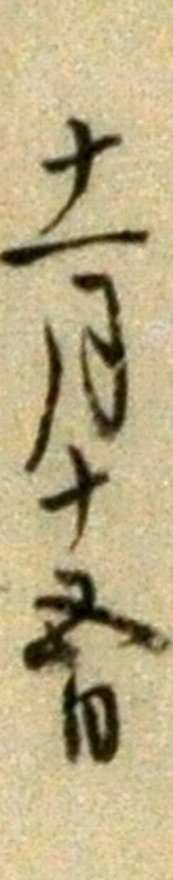十一月十五日
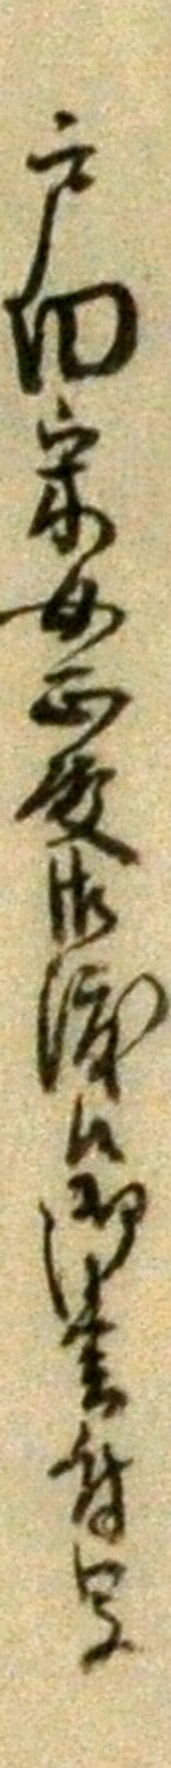戸田采女正殿御渡候御書付写
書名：若君様御色直御祝儀ノ節ノ留
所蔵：伊那市立高遠町図書館・合同会社AMANE
